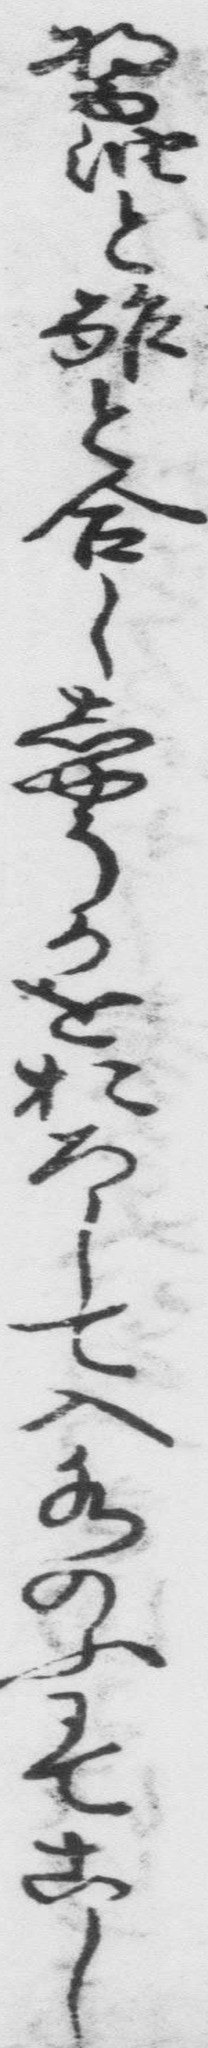醤油と酢と合し志やうかを於ろして入水のふ尓て古し
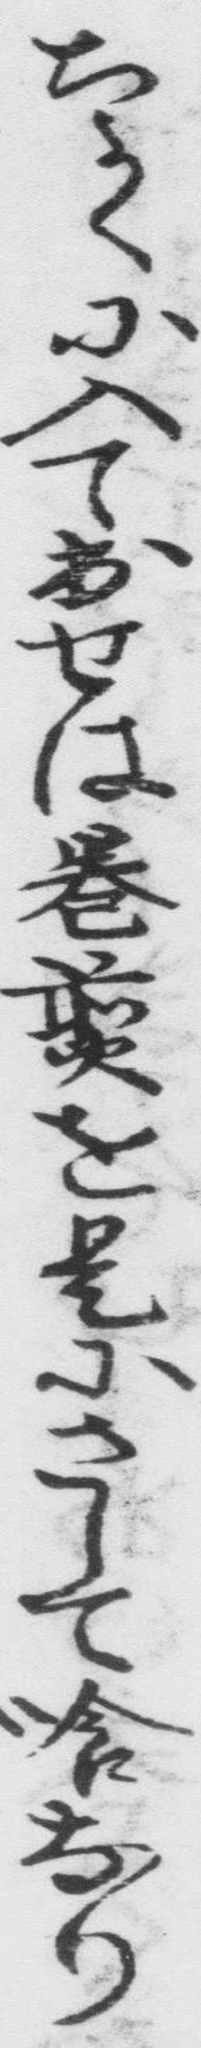ちよく尓入て出せは巻煎を是尓さして喰なり
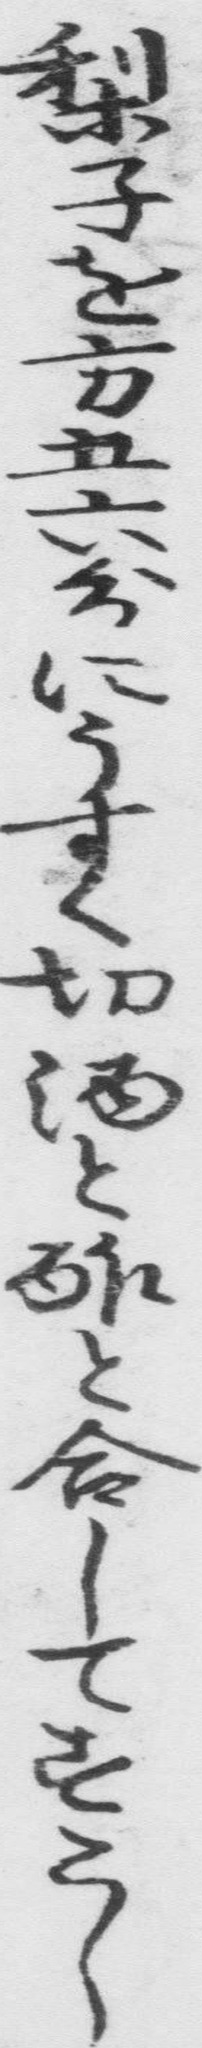梨子を方五六分にうすく切酒と酢と合して春こし
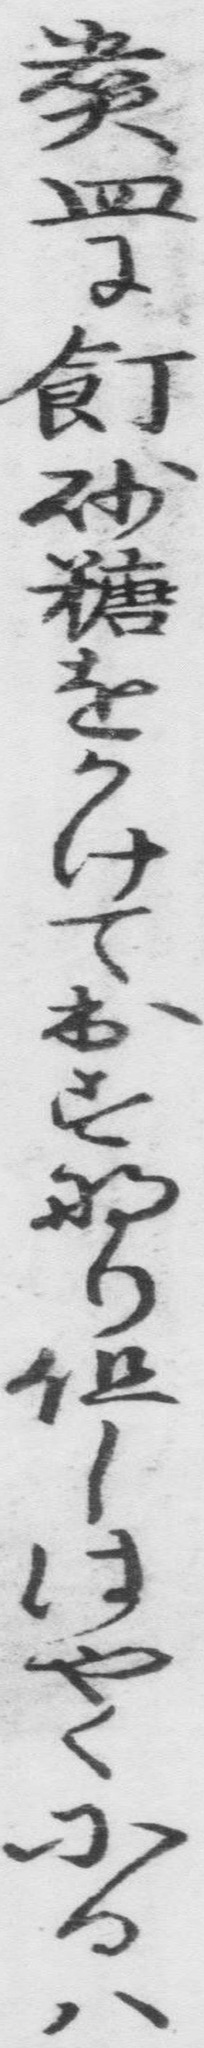煮皿尓飣砂糖をかけて出春那り但しはやく尓るは
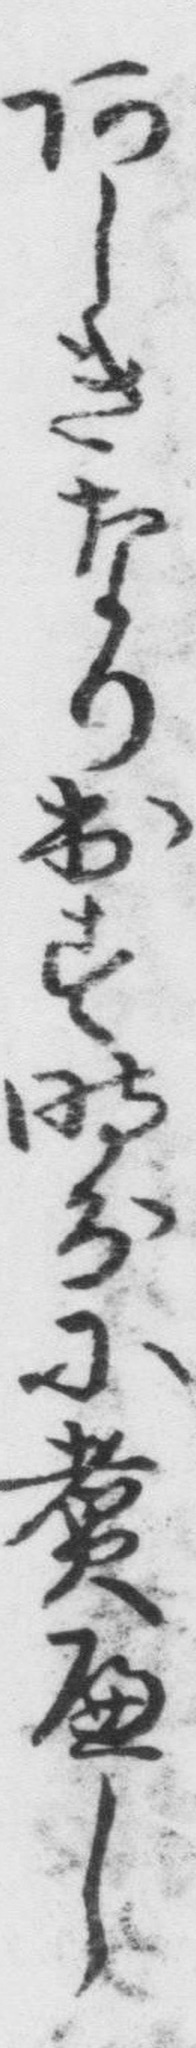阿しきなり出春時分尓煮扁し
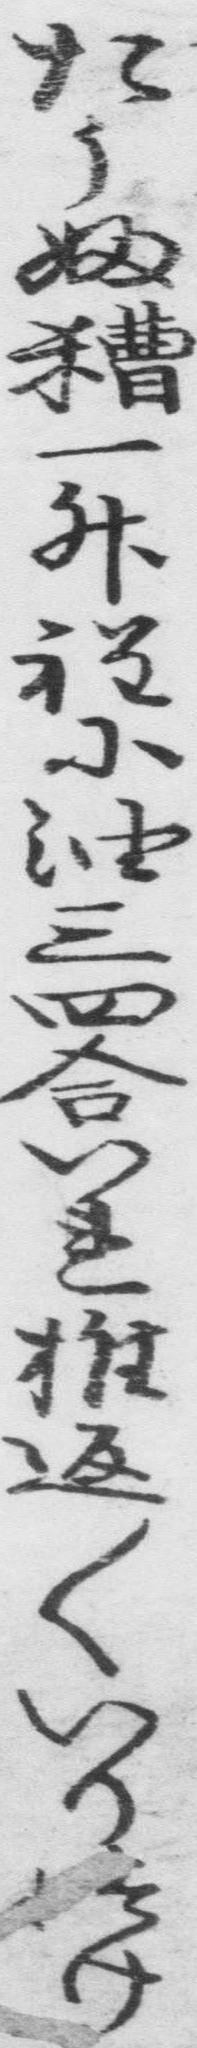たう婦糟一升程尓油三四合以連推返〳〵いり徒け
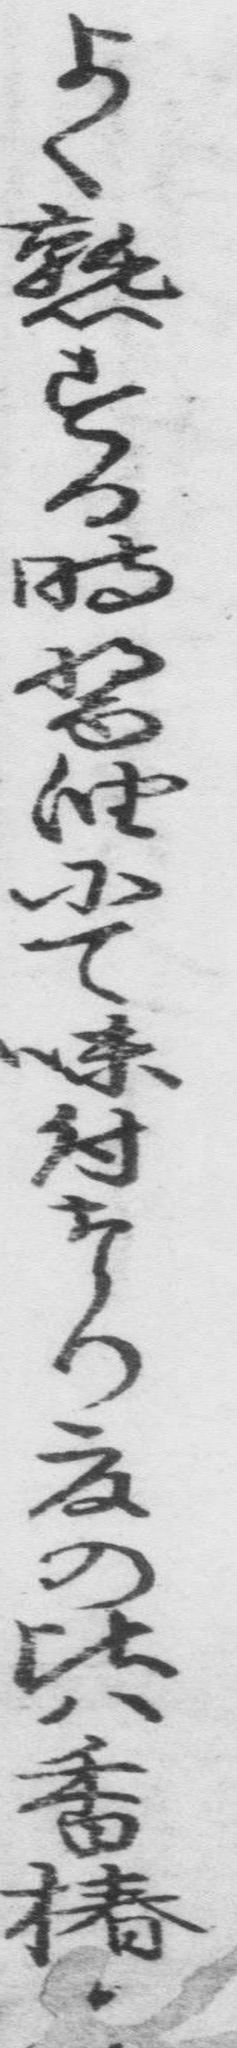よく熟春る時醤油尓て味付なり度の比は香椿と

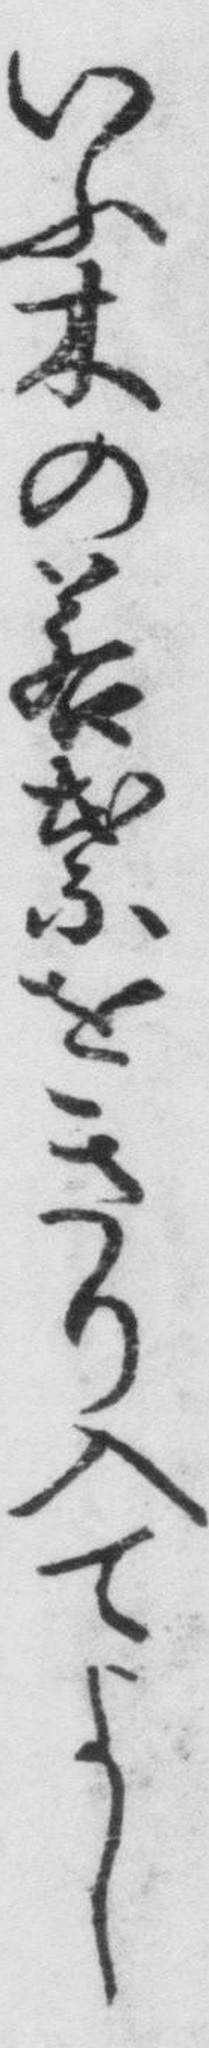いふ木の茶葉をきり入てよし
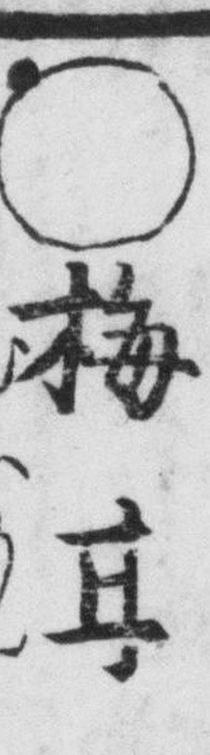〇梅甘
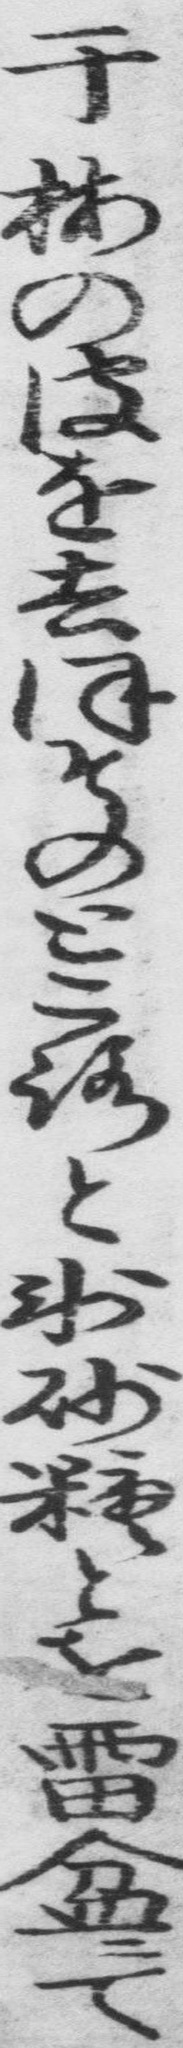干梅の皮を去ほそのとこ路と氷砂糖とを雷盆にて
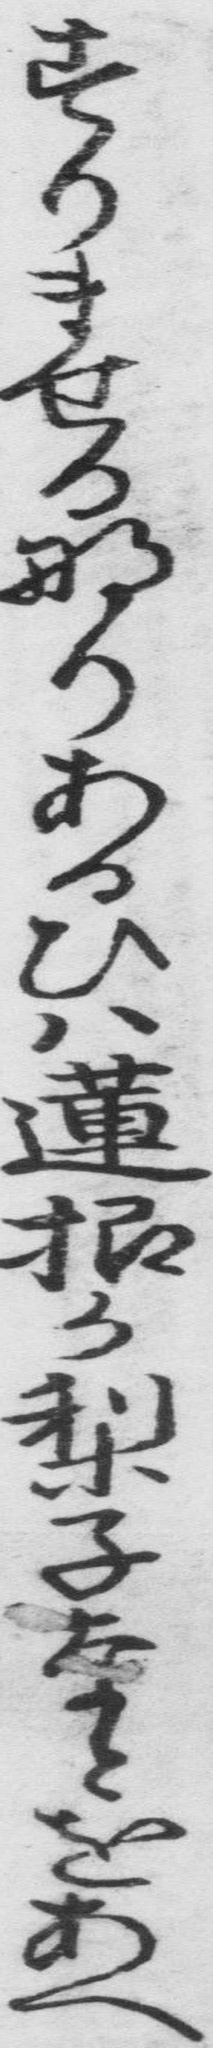春りませる那りあるひは蓮根か梨子なとをあへ
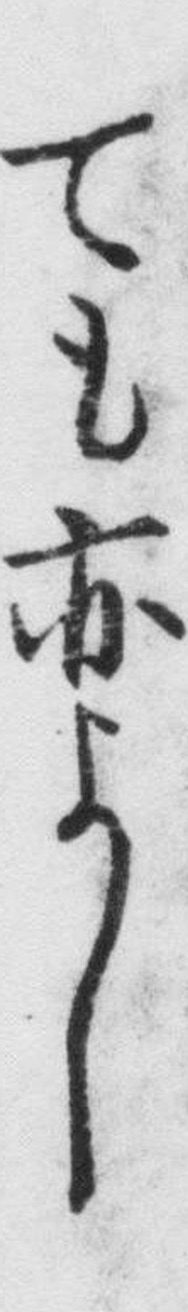ても亦よし
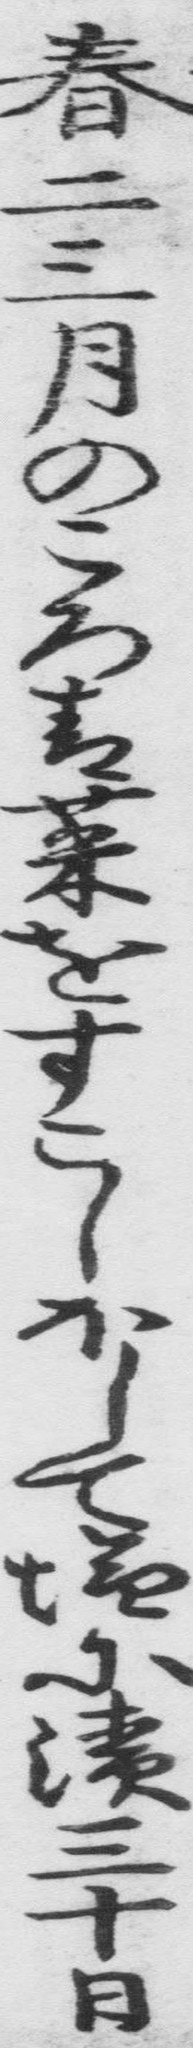春二三月のころ青菜をすこし不して塩尓漬三十日
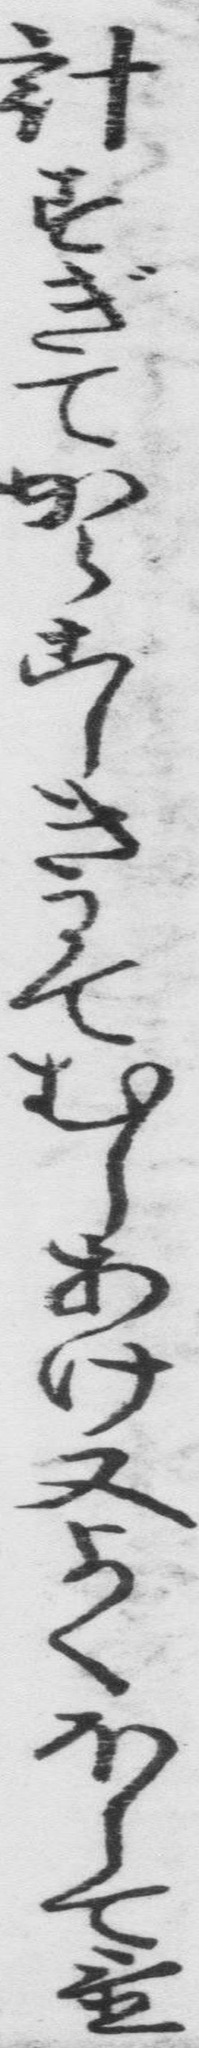計春ぎてから古しき尓てむしあけ又よく不して置
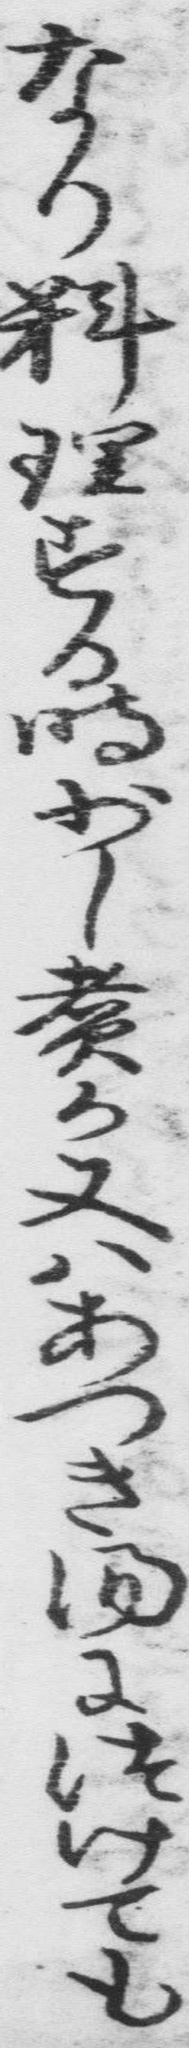なり料理春る時少し煮か又はあつき湯尓徒けても
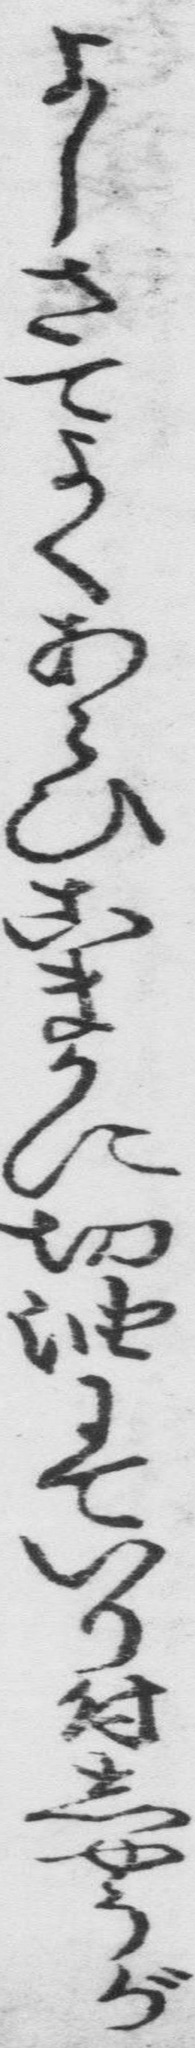よしさてよくあらひ古まかに切油尓ていり付志やうが
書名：普茶料理抄
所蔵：大阪府立大学学術情報センター 国文学研究資料館
